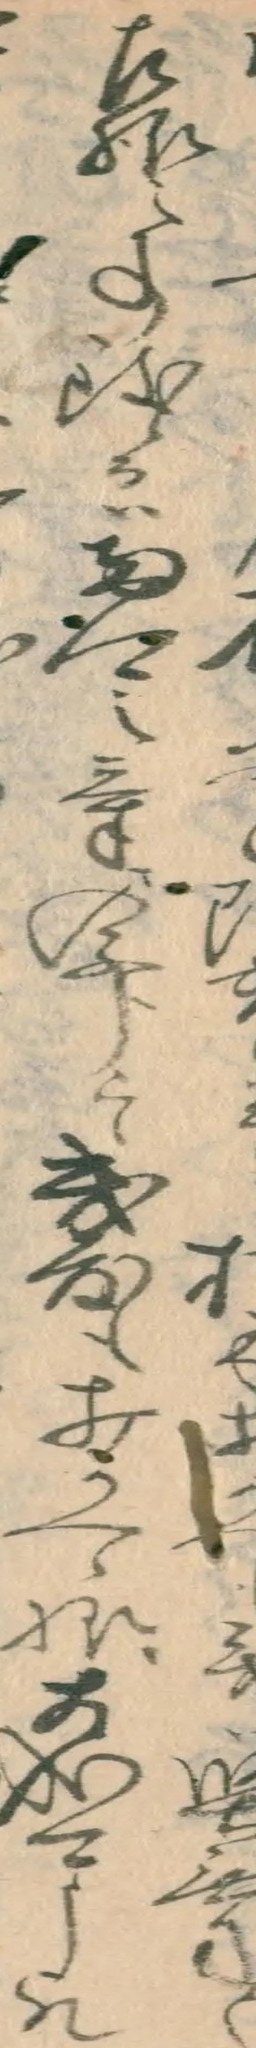左様之事致候而ハ両郷之気ニ入不申候ハヽ幾度も打かへ候様ニ相成可申歟
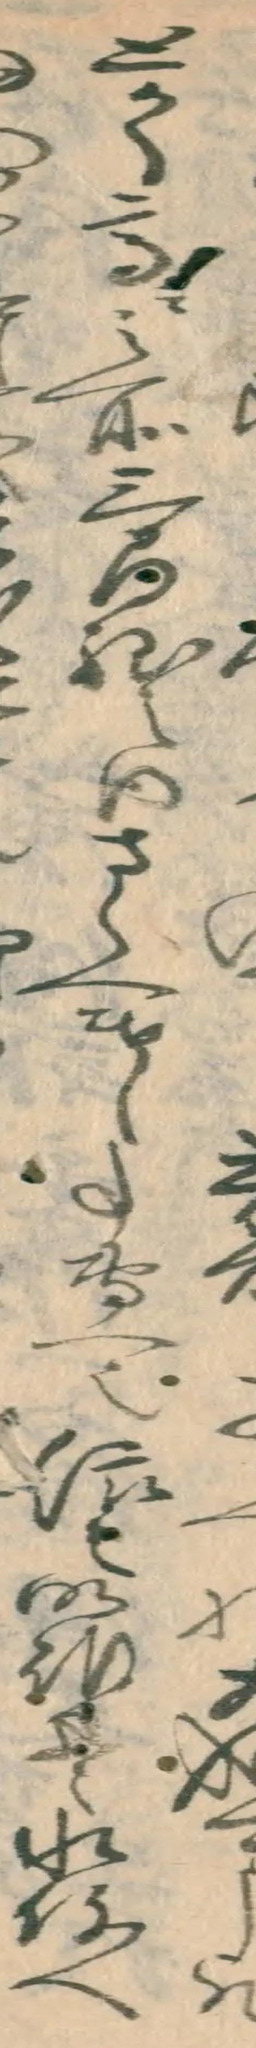とかく高ミ之所三間程之内さらへ遣候事専一也依之明朝早々水役人
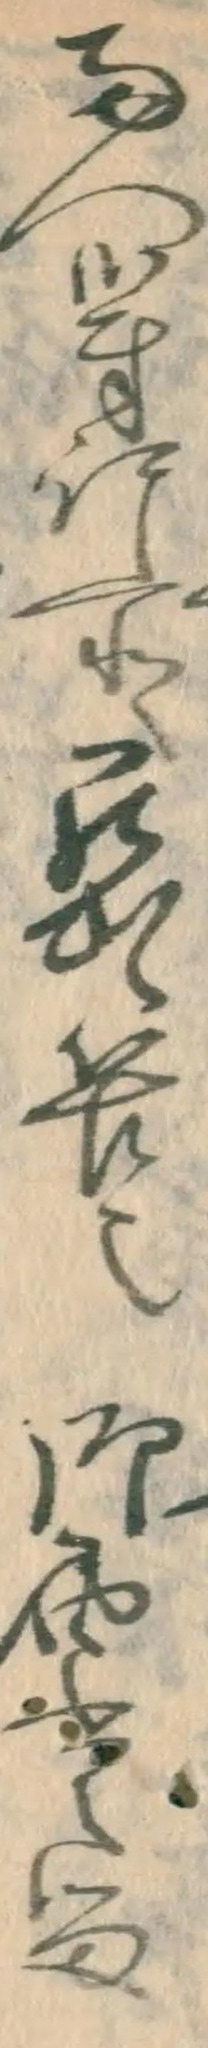両人御奉行所へ罷出候筈也御届書之留
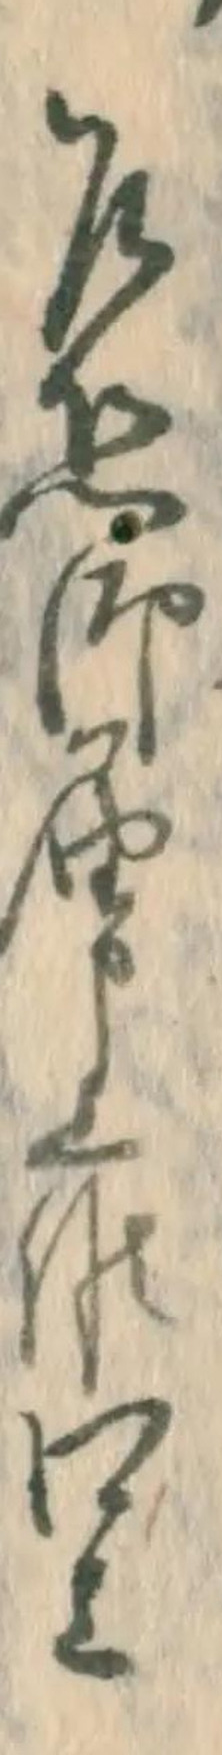乍恐御届申上候口上
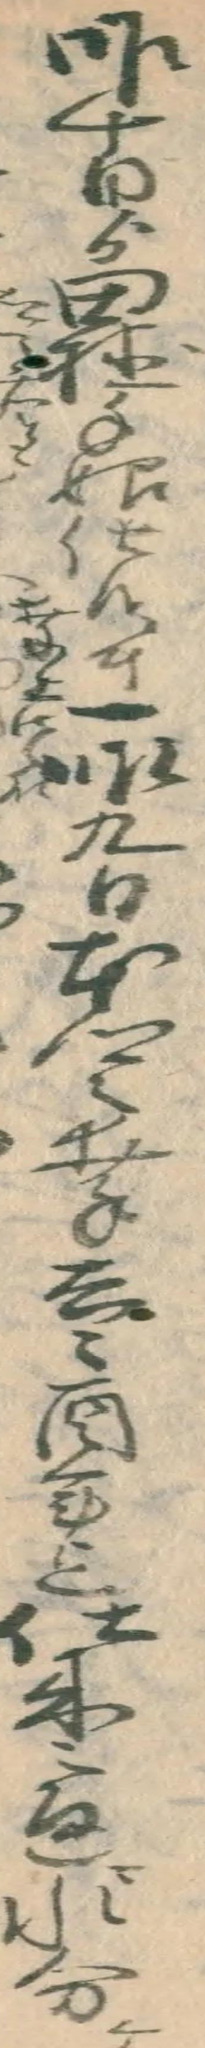昨十日ゟ田植手始仕候ニ付一昨九日本郷之井手去々酉年迄仕来之通ニ水分ヶ
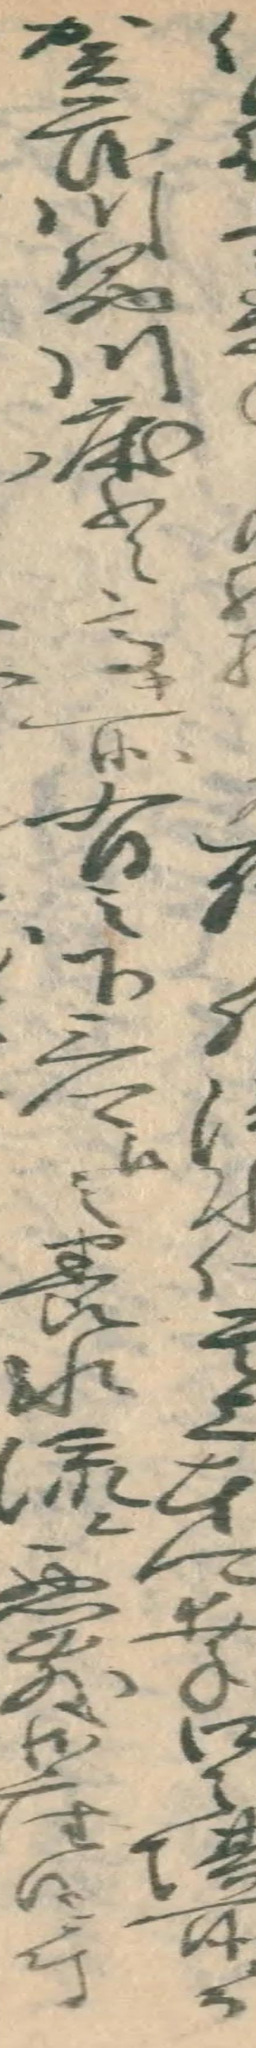賀茂川筋川床少々高キ所有之下三郷江之養水流レ悪敷御座候ニ付
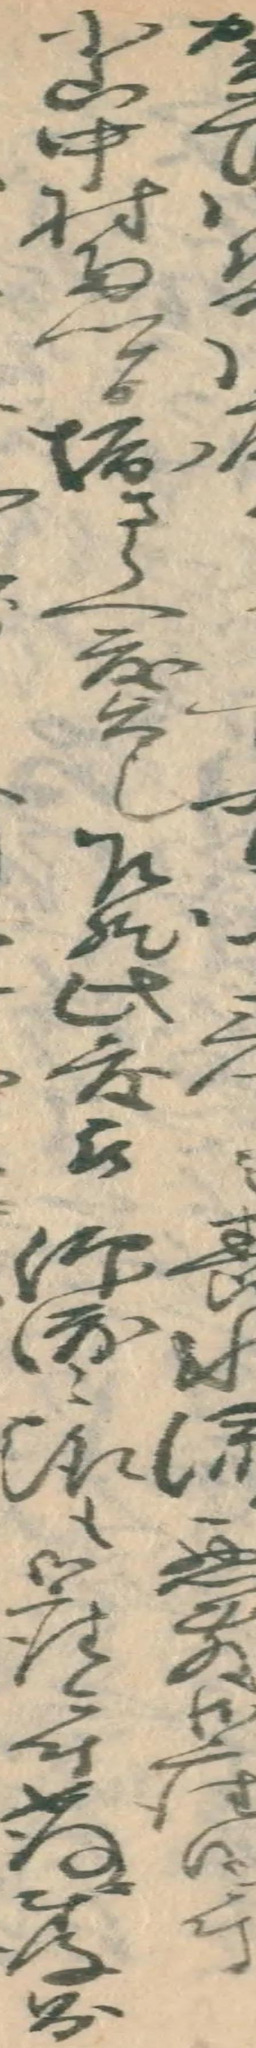小山中村両郷ゟ掘さらへ度旨申候乍然此度被仰渡候趣も御座候ニ付如何奉存則
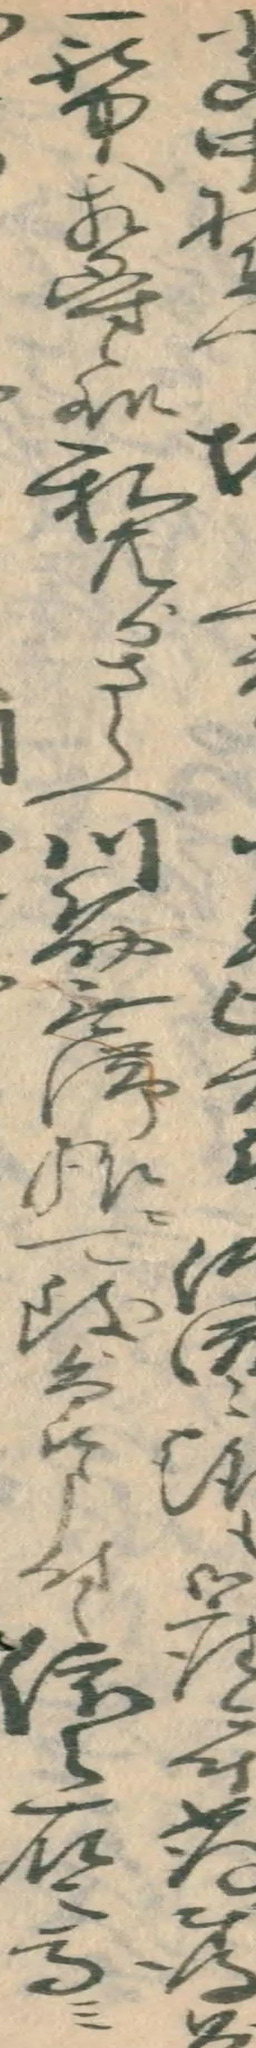一社中へ相尋候処私共ゟさらへ川筋無滞様ニ可致旨被申付候依之右之高ミ
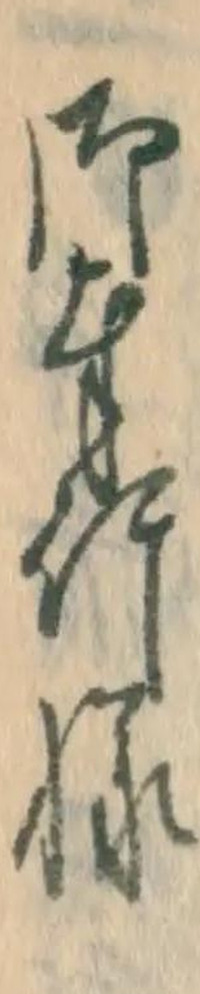御奉行様

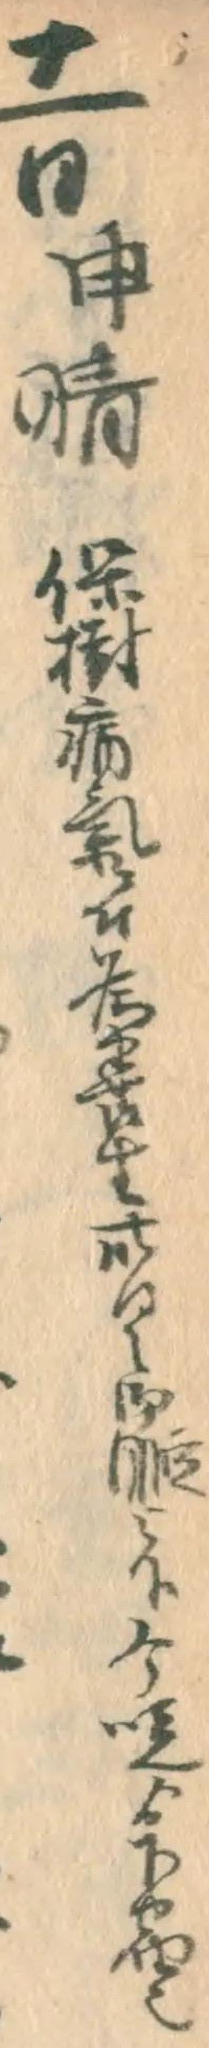十一日申晴保樹病気ニ付為養生卅日之御暇被下今晩ゟ下宿也
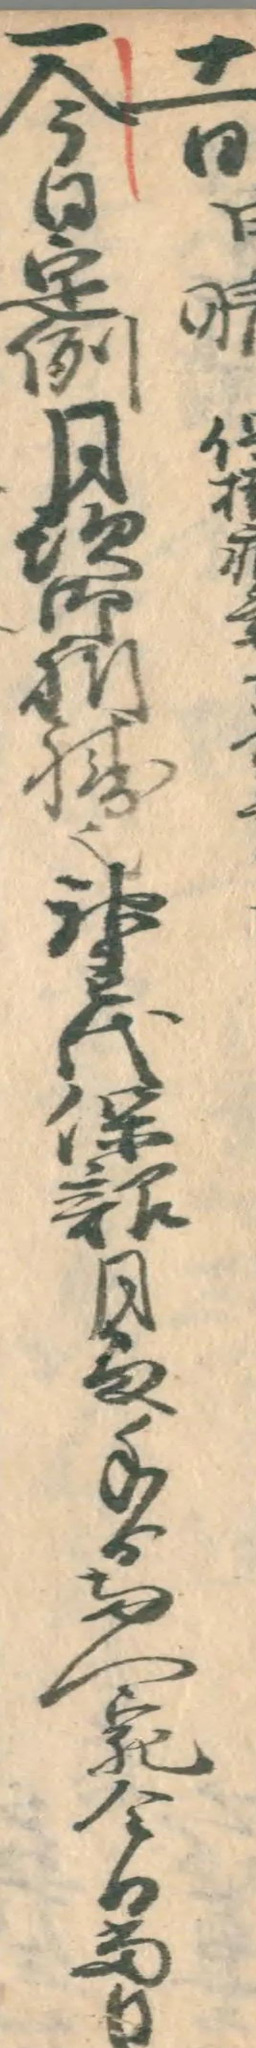一今日定例月次御祈祷也神主代保韶月番手ゟ両人宛今日当日
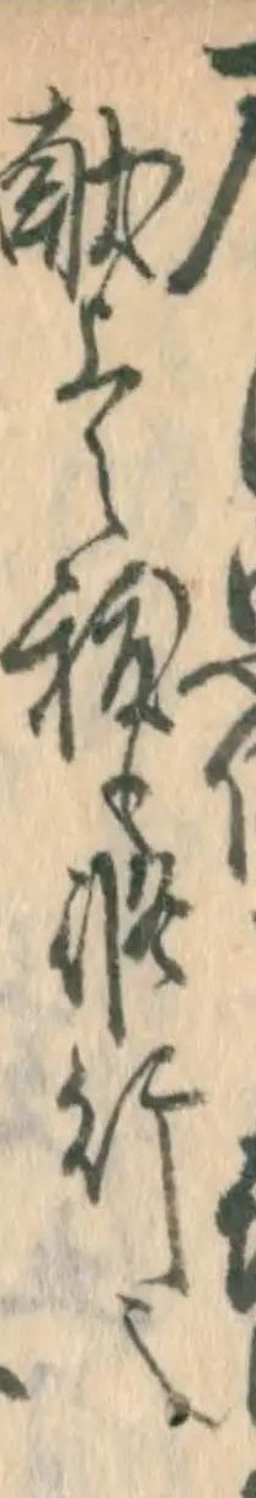献上之祓も修行也
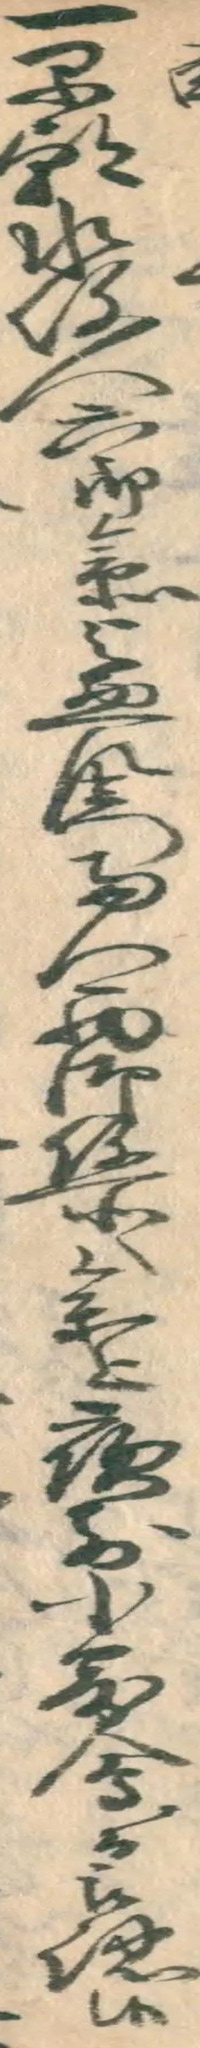一早朝水役人六郎兵衛与惣左衛門両人西御役所へ参上夜前小寄会ニ而被認候
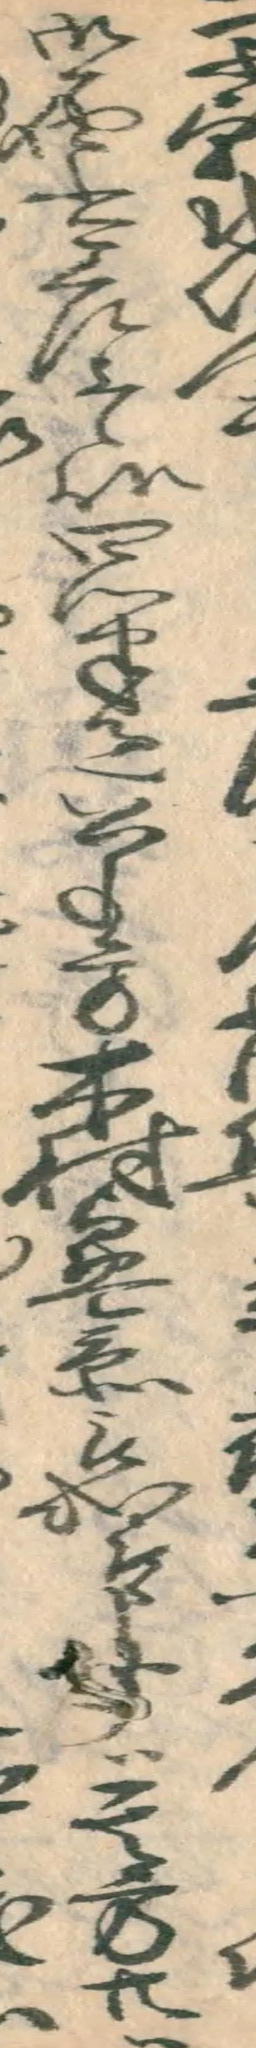御届書差上候処四ツ半過公事方木村与惣兵衛被出被申聞ハ其方共ハ
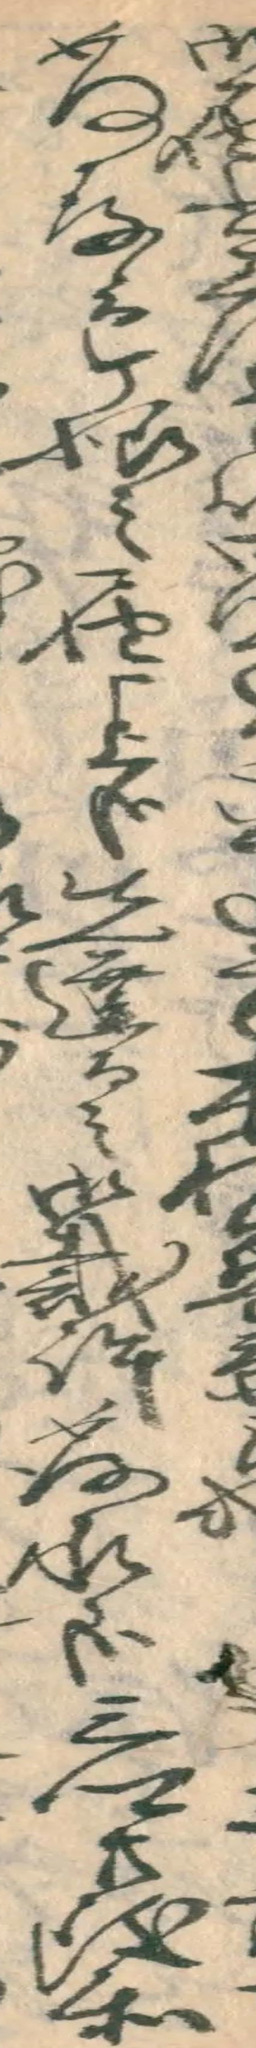如何存候而ケ様之届申上哉先達而之御裁許如何承候哉三郷共致和
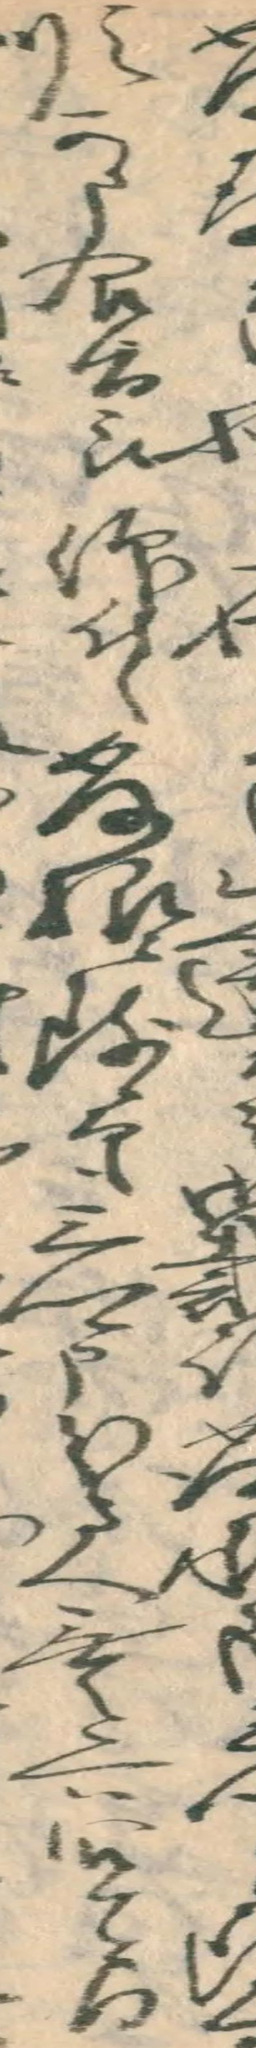順可申合旨被仰付候如何様ニ致候而も三郷申分さへ無之候へハ宜候間
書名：賀茂社記録. 第58冊
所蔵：国立国会図書館 National Diet Library, JAPAN
